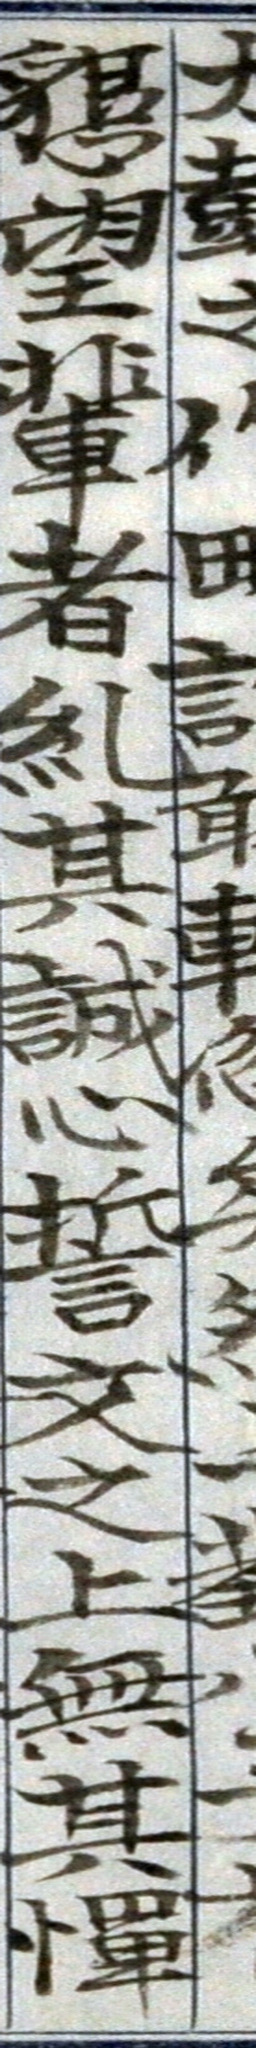懇望輩者糺其誠心せい誓文之上無其憚
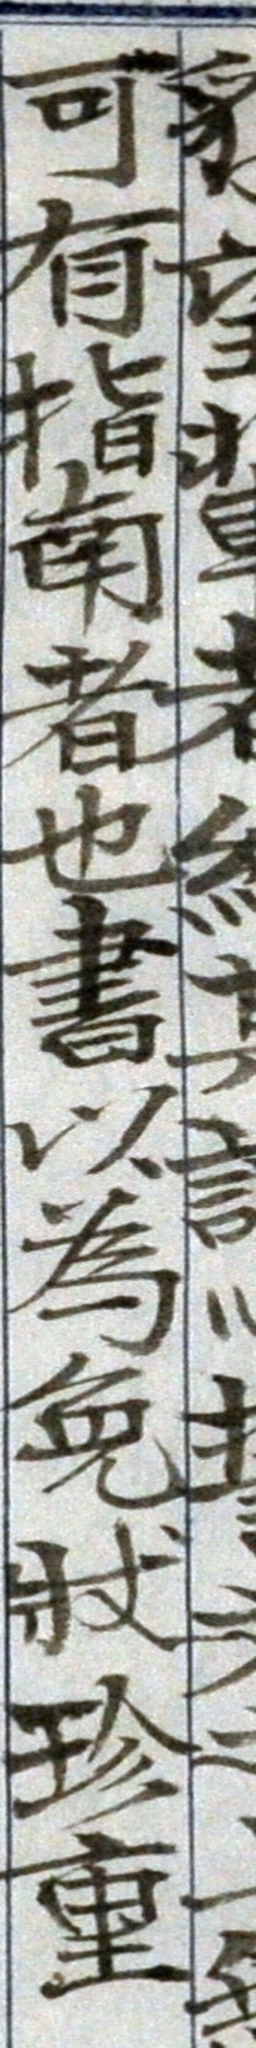可有指南者也書以為免状珍重
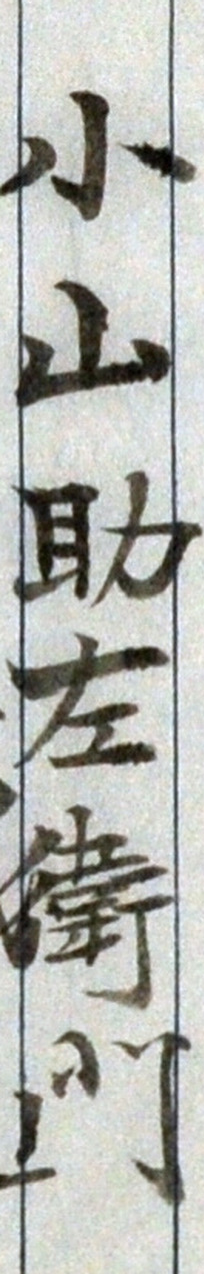小山助左衛門
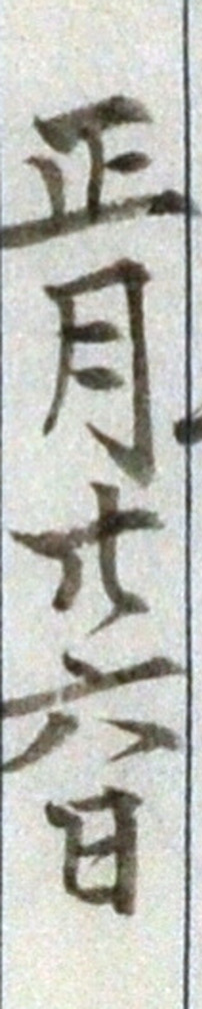正月廿六日
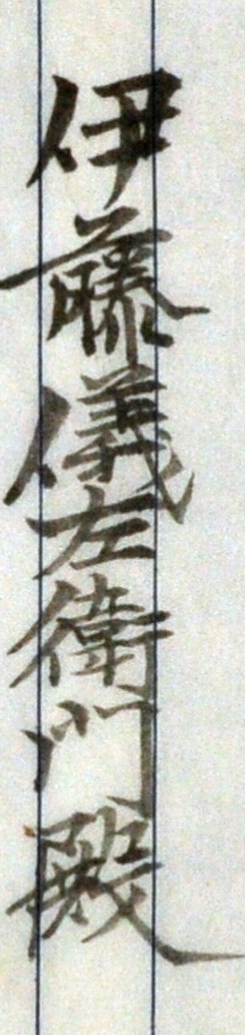伊藤儀左衛門殿
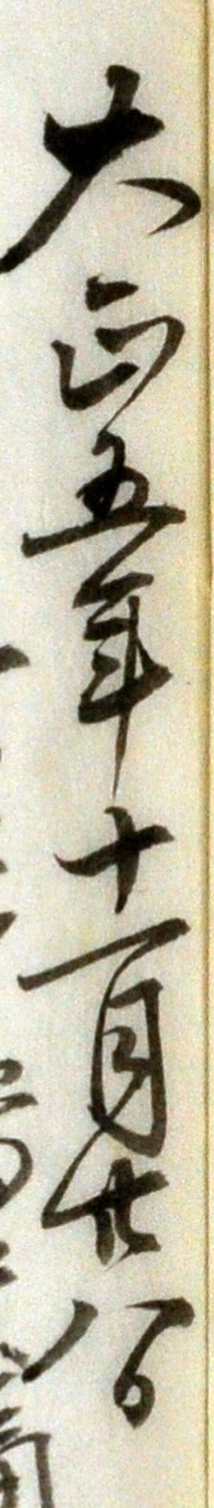大正五年十一月廿八日
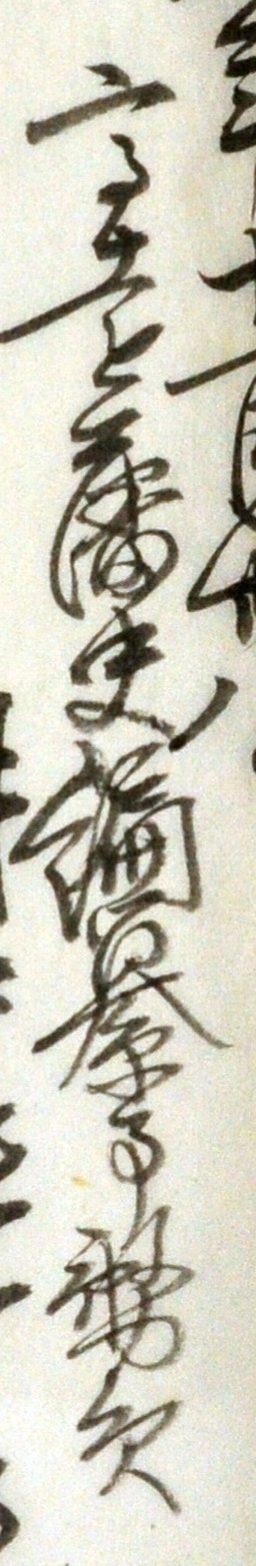高遠藩史編纂事務員
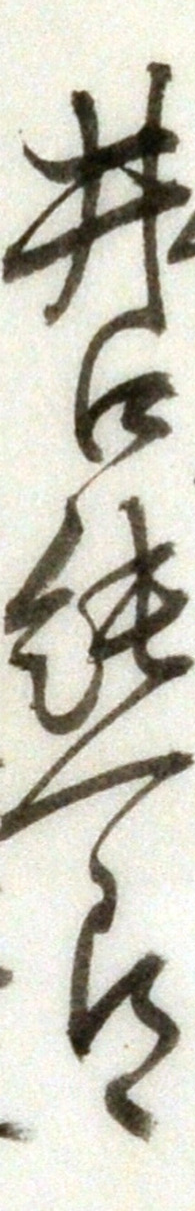井口純一郎

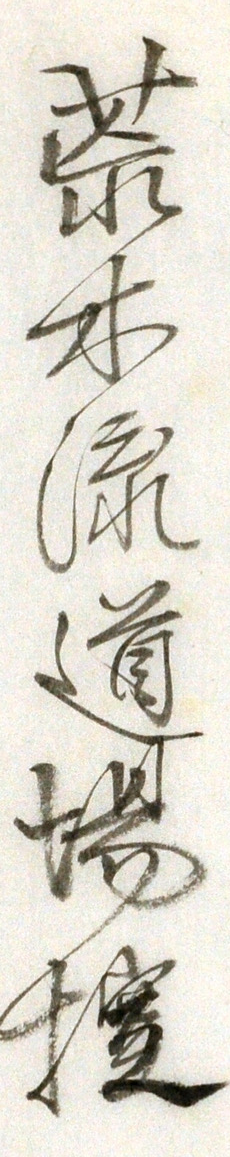荒木流道場掟

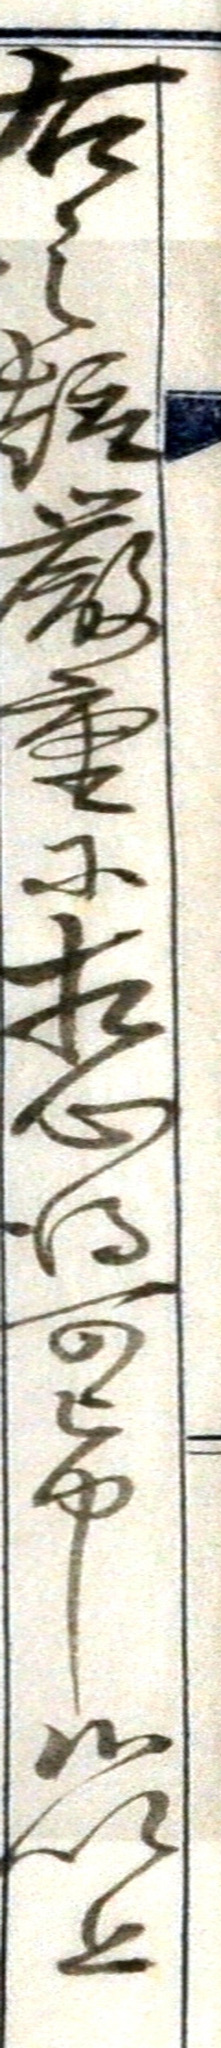右之趣厳重に相心得可被申候以上
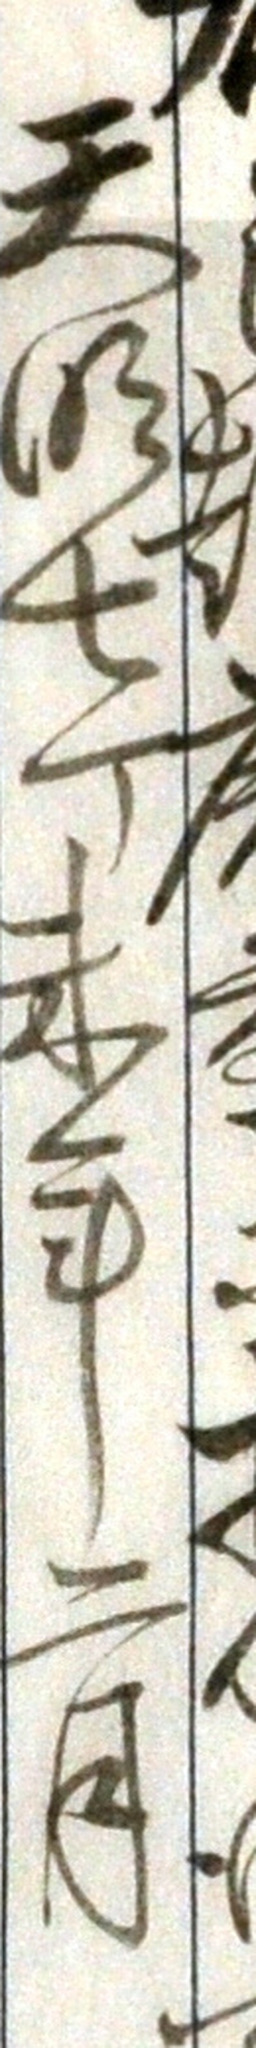天明七丁未年二月
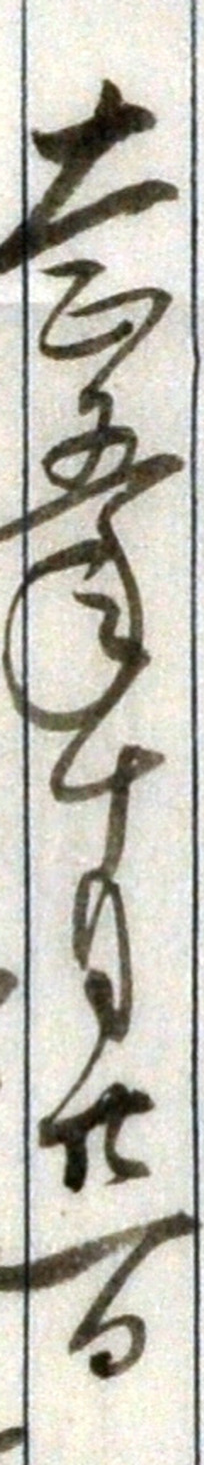大正五年十月廿一日
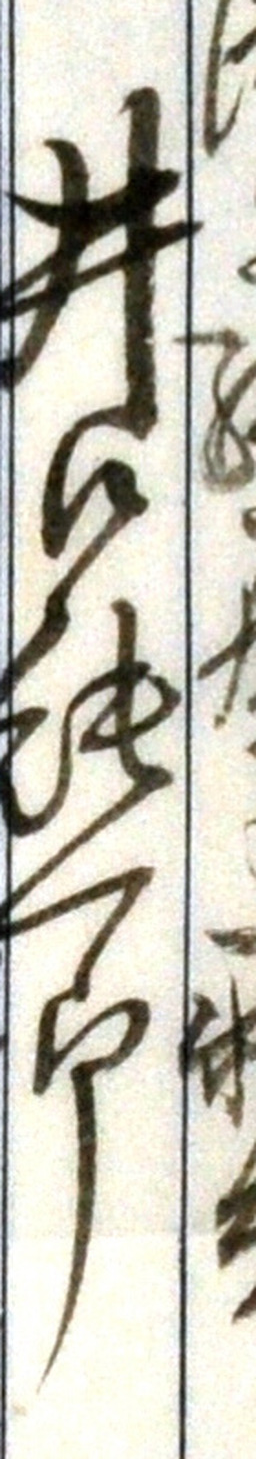井口純一郎
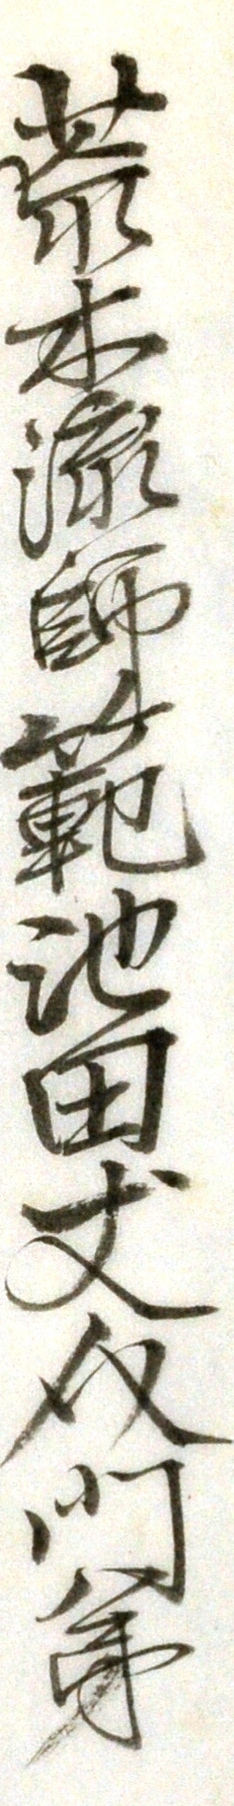荒木流師範池田丈介門弟
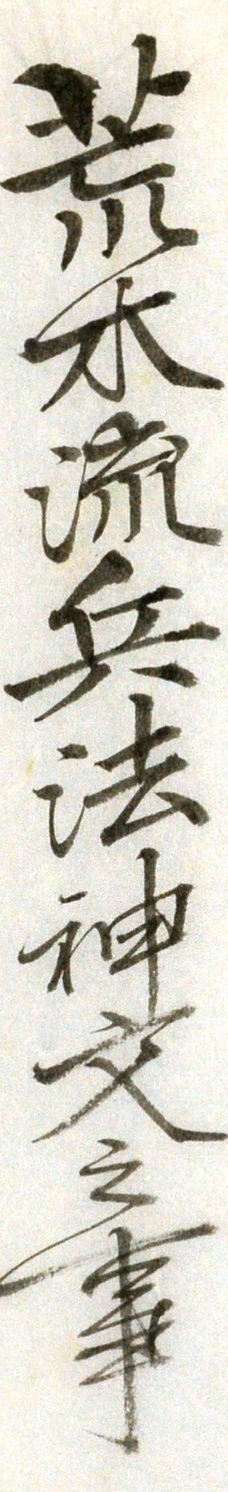荒木流兵法神文之事

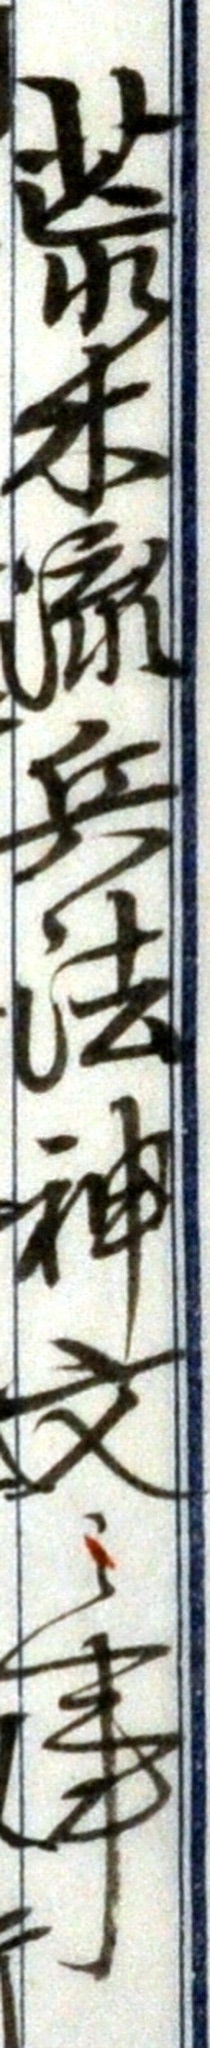荒木流兵法神文之事
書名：竹内流・甲州流・荒木流・一刀流新当流起請文及免許写堤宝山流手鏡及個之大事
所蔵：伊那市立高遠町図書館・合同会社AMANE
